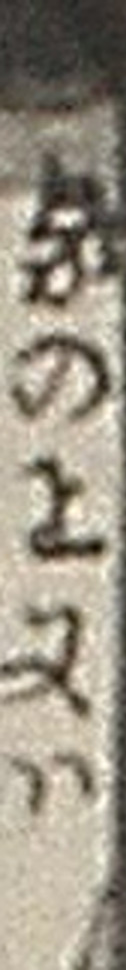家の上又は
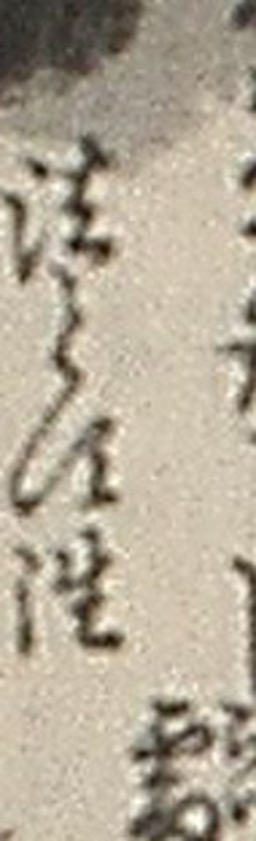法とす往
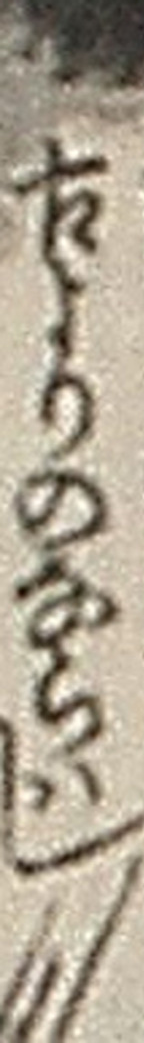古よりのならはし
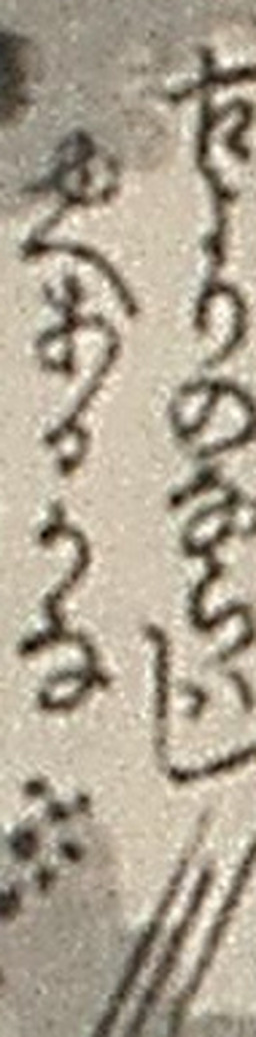ゆへあるかな
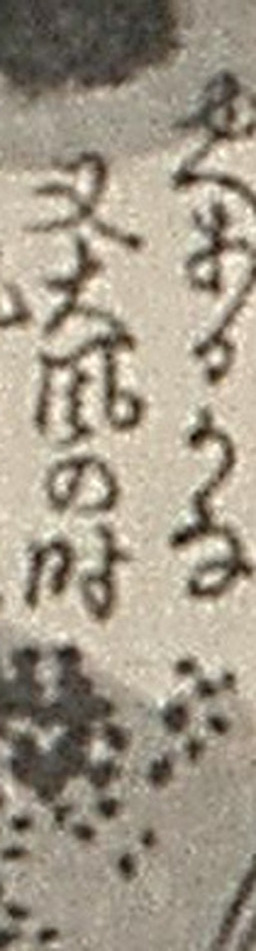又大風の時
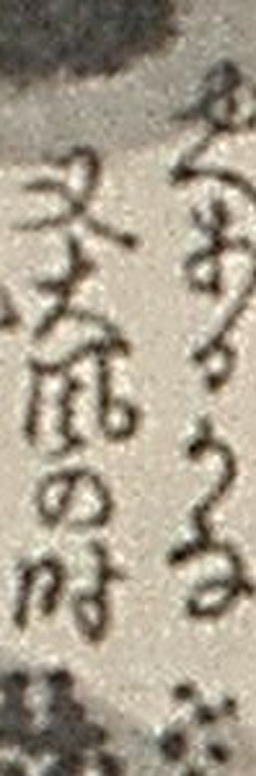又大風の時
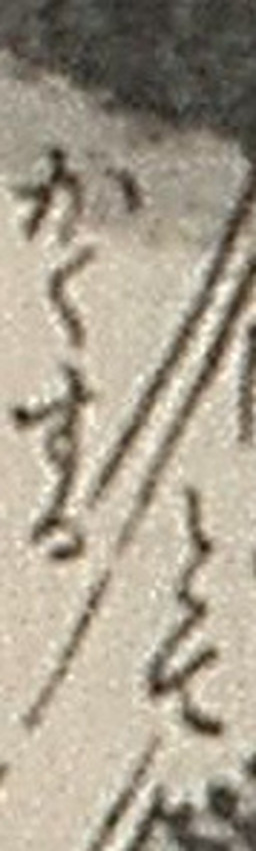かくする国も

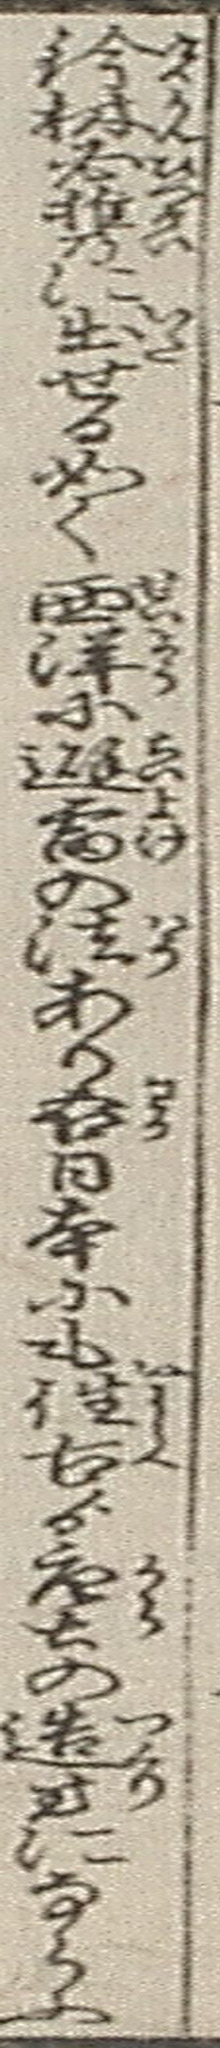鈐林必携に出せる如く西洋に避雷の法あり吾日本にも往古ゟ唐土の造方にならふ
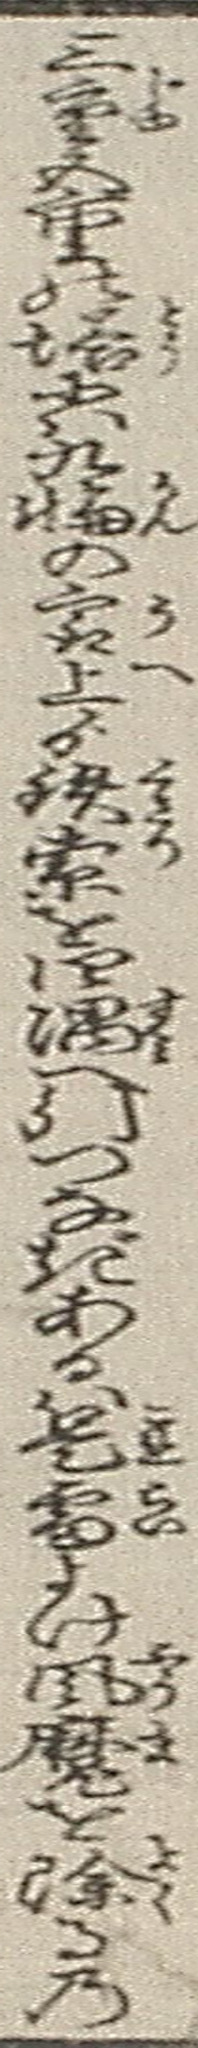三重五重の塔には九輪の最上ゟ鉄索を四隅へ引つなぎあるは是雷よけ風魔を除るの
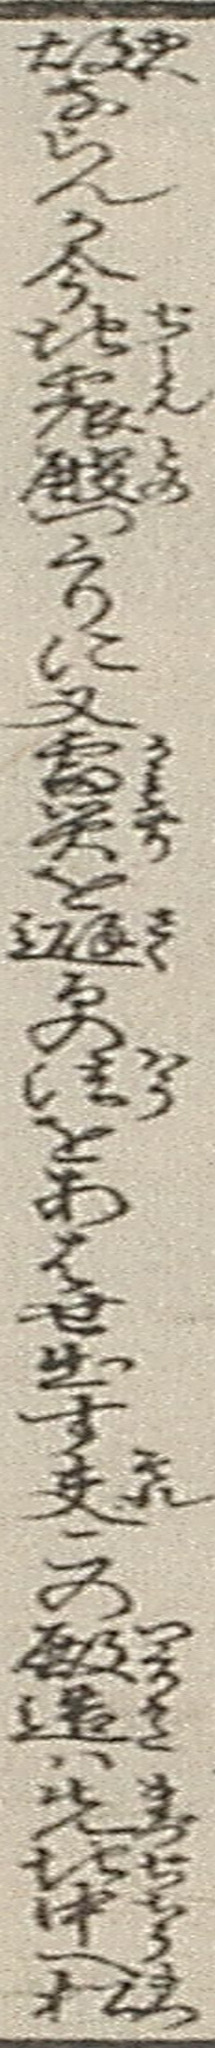故ならんか今地震殿つくりに又雷災を避るの法をあはせ出す夫この殿造は先地中へ松
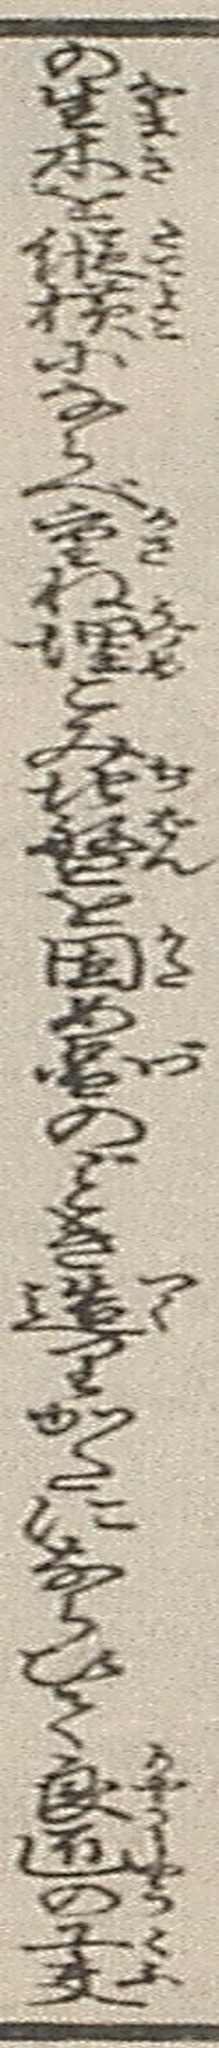の生木を縦横にならべ重ね埋こみ地盤を固め図のごとき造りかたにならひて良匠の工夫
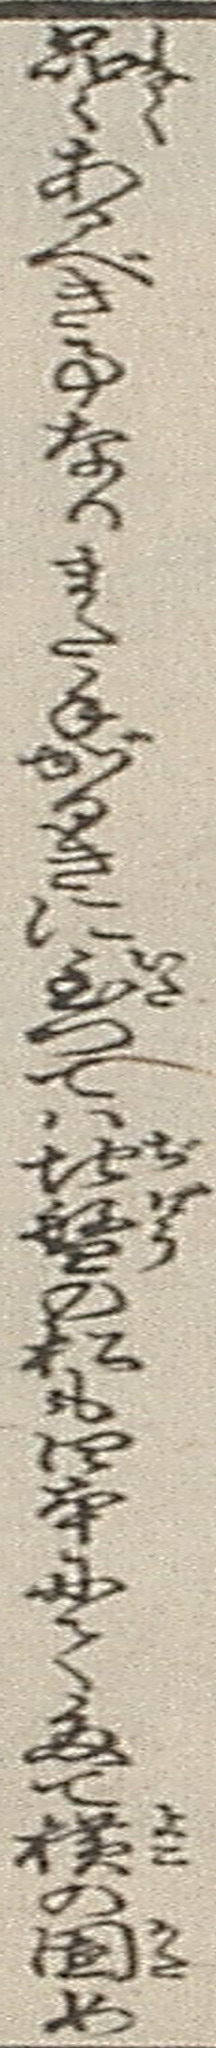品々あるべき事なりまた手がるきに至つては地盤の松も四本にてたて横の固め
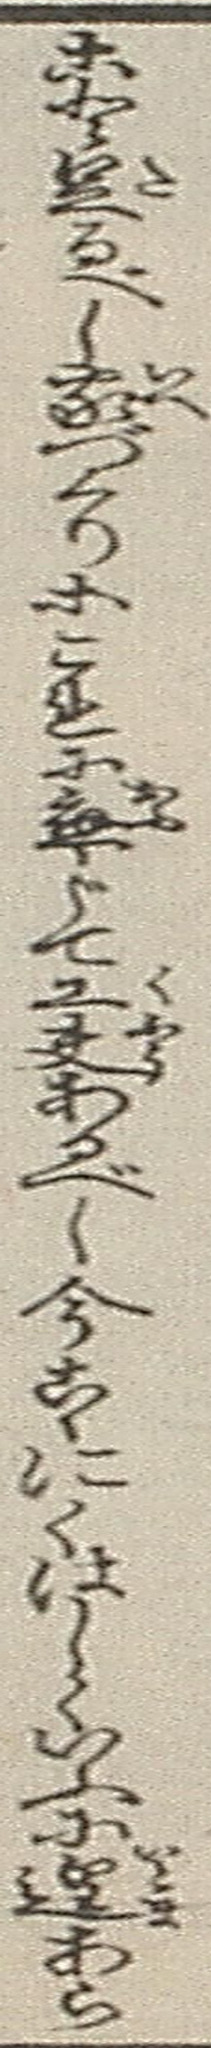こと足るべし家づくり等これに応じて工夫あるべし今こゝにくはしくいふに遑あら
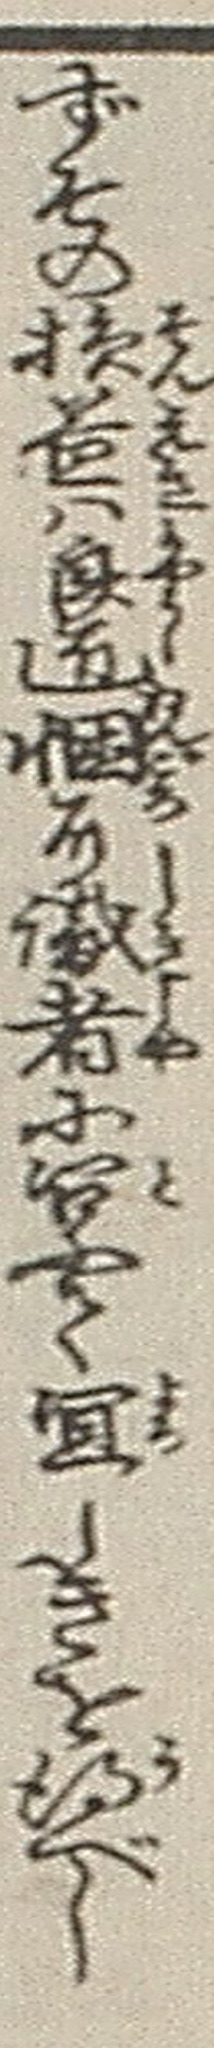ずその損益は良匠悃に識者に問ふて宜しきを得べし
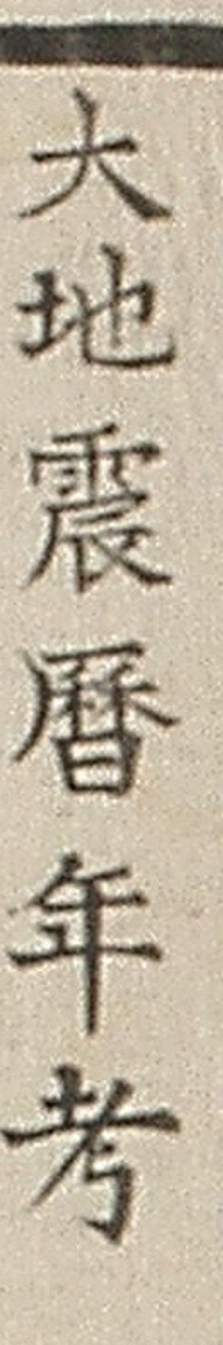大地震暦年考
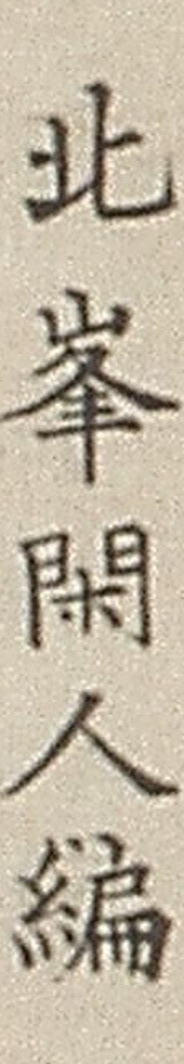北峯閑人編
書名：大地震暦年考　全
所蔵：東京大学地震研究所図書室 Earthquake Research Institute Library, The University of Tokyo, JAPAN
